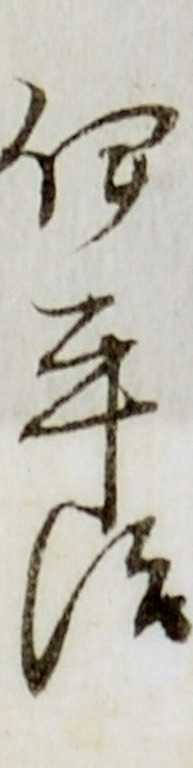伊平治
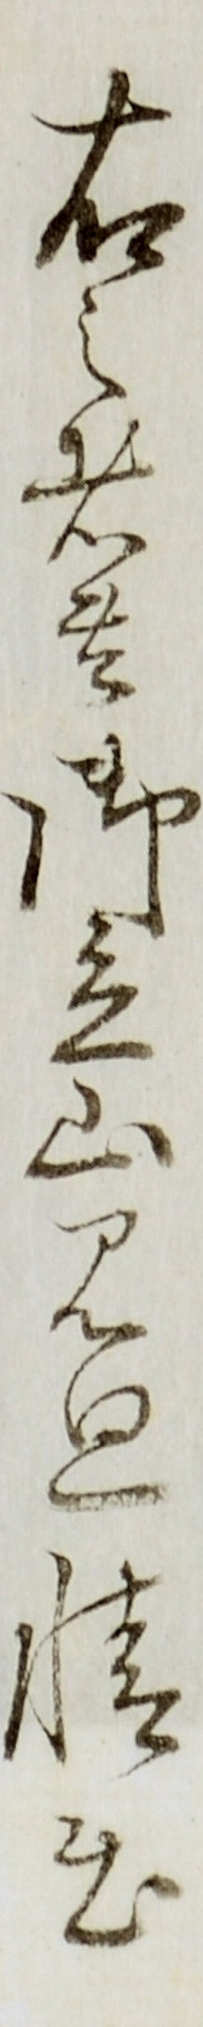右之者共御立山見廻情出
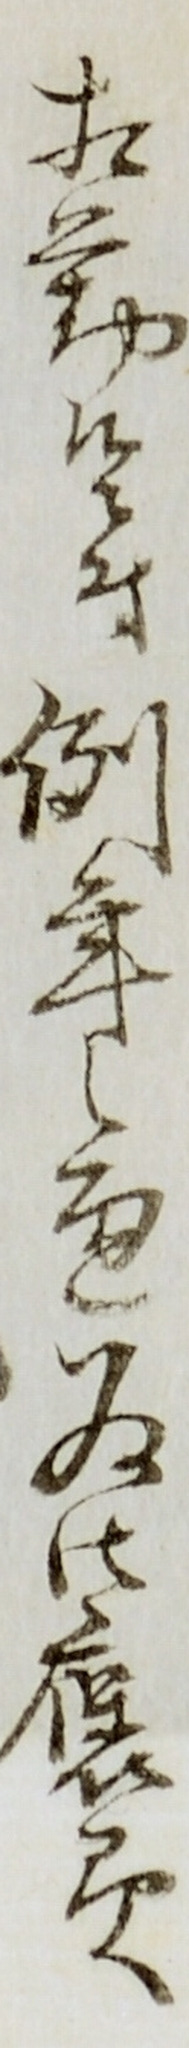相勤候に付例年之通為御褒美
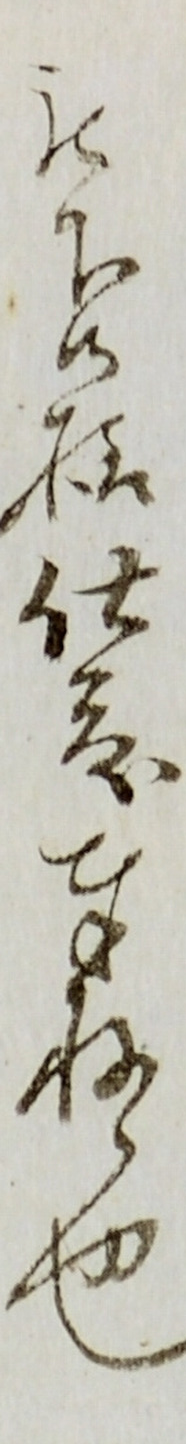被下候様仕度奉存候也
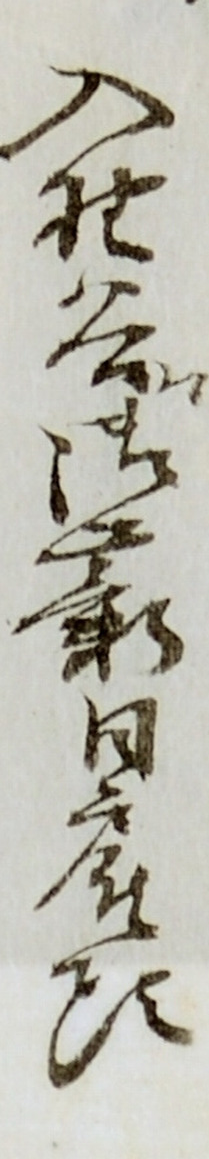入野谷御薪日雇頭
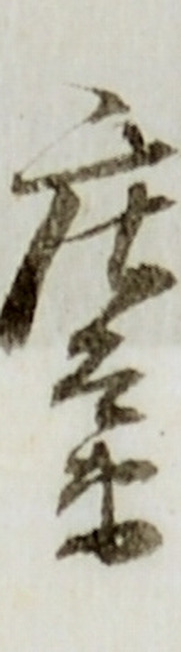太兵衛
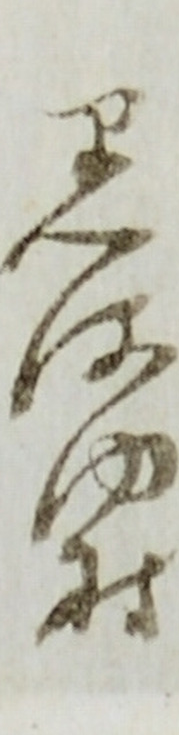黒河内村
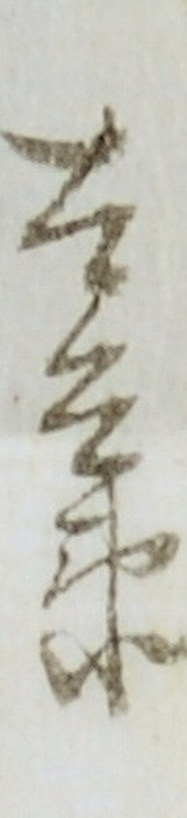太兵衛
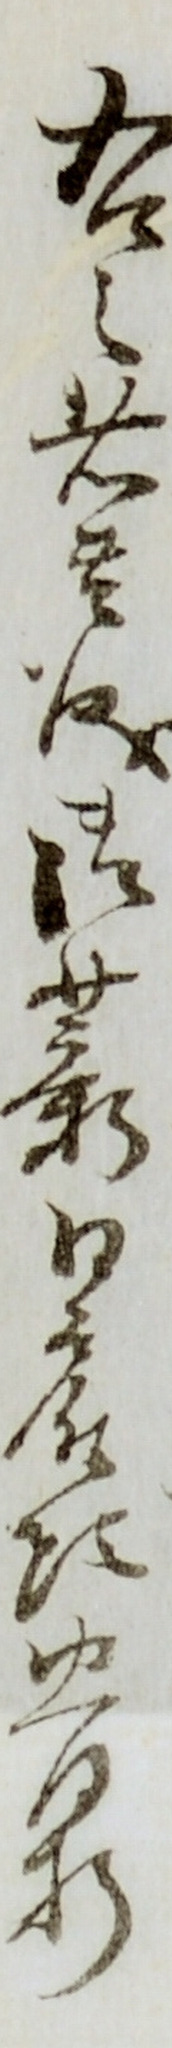右之者共儀御薪日雇頭骨折
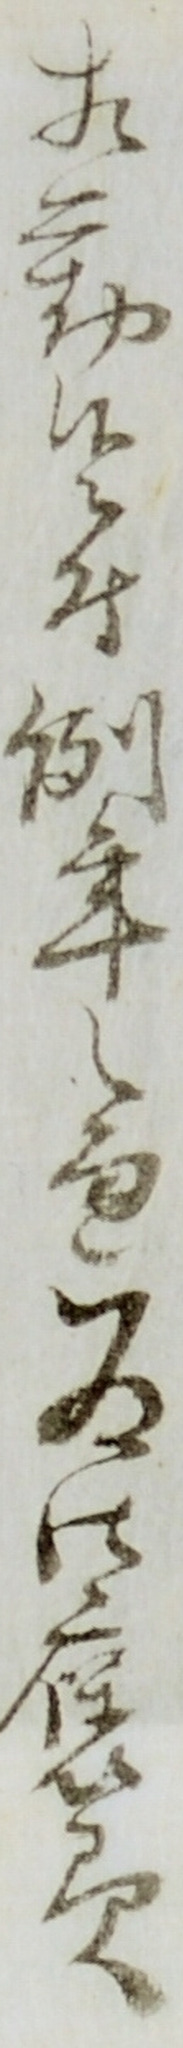相勤候に付例年之通為御褒美
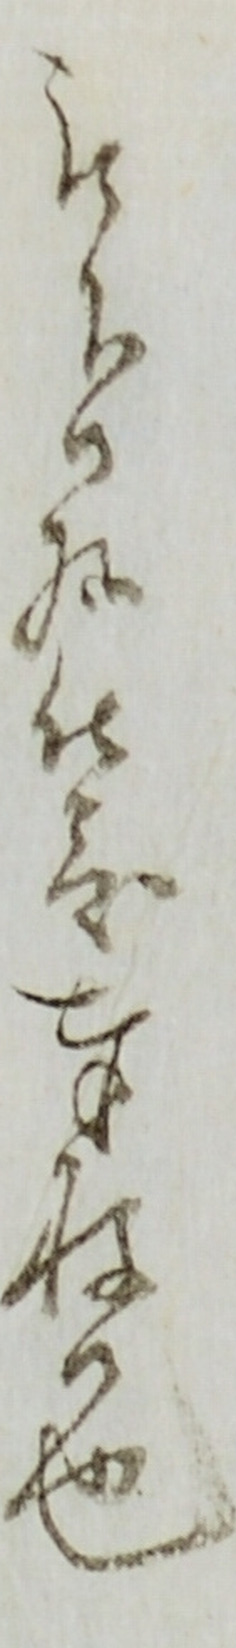被下候様仕度奉存候也

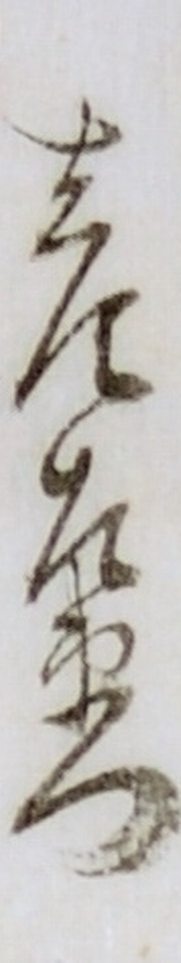彦左衛門
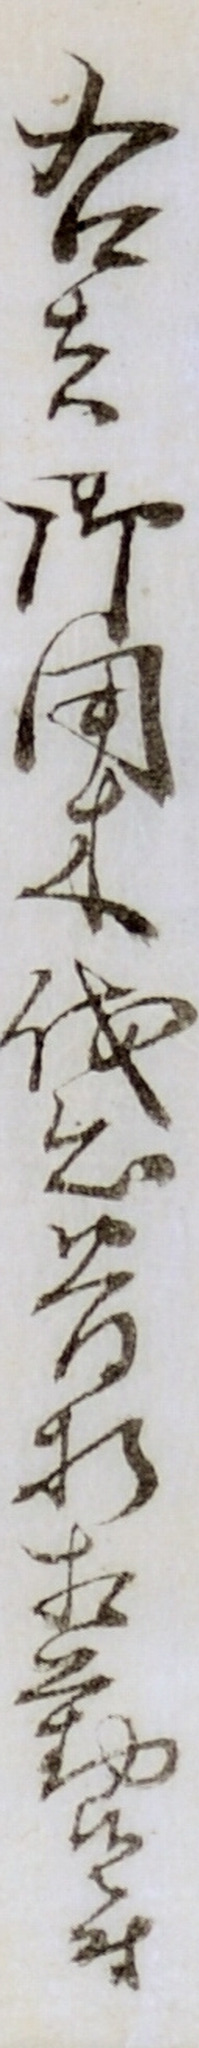右は御用木伐出骨折相勤候に付
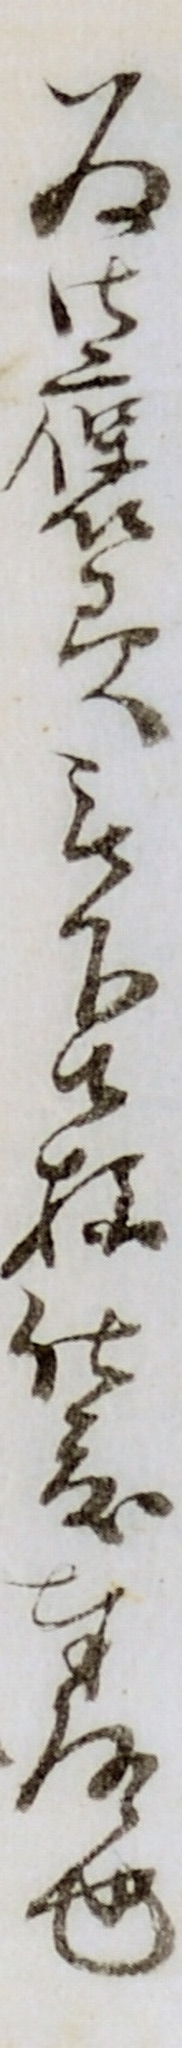為御褒美被下候様仕度奉存候也
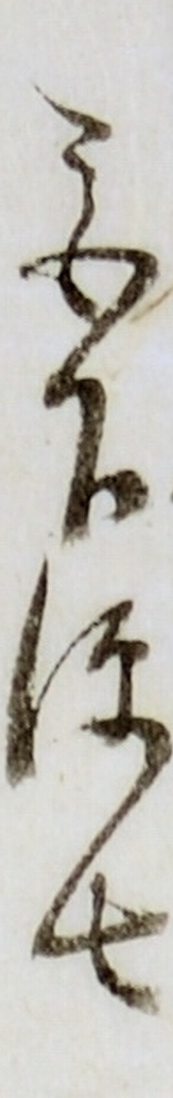宮下源七
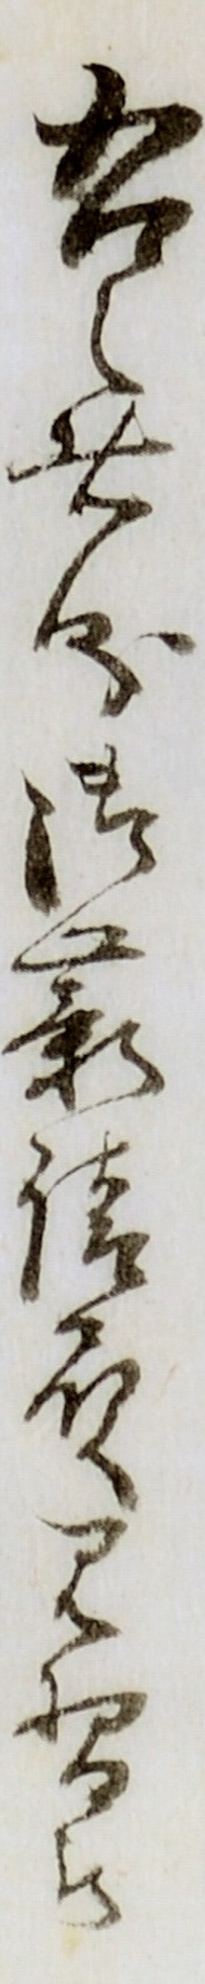右之者儀御薪請負見習被
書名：山林方諸事御用留
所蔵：伊那市立高遠町図書館・合同会社AMANE
